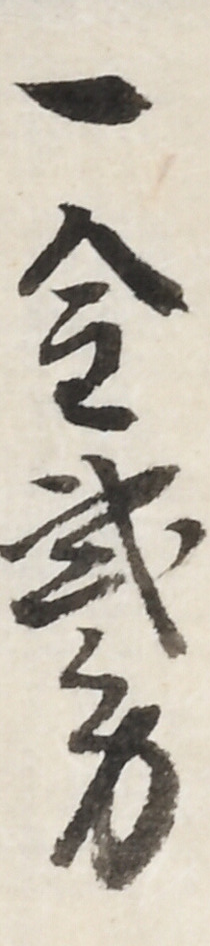一金弐分
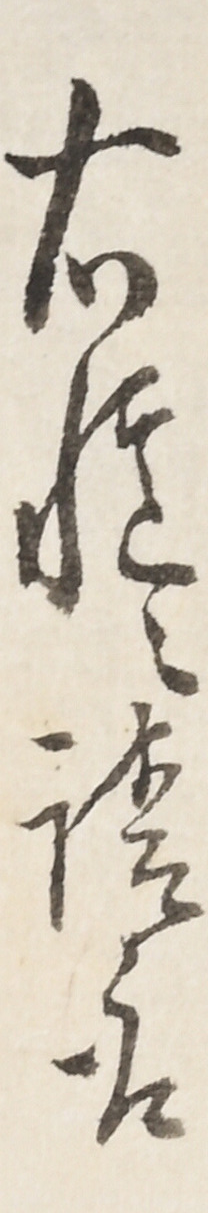右慥ニ請取
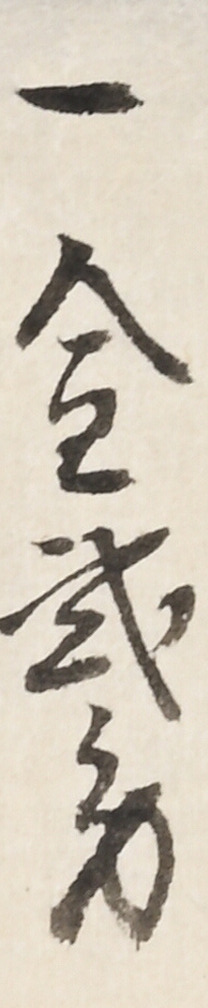一金弐分
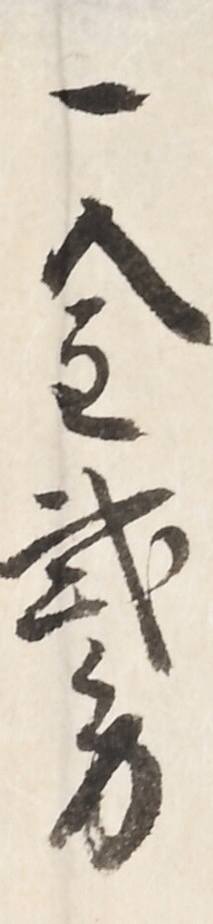一金弐分
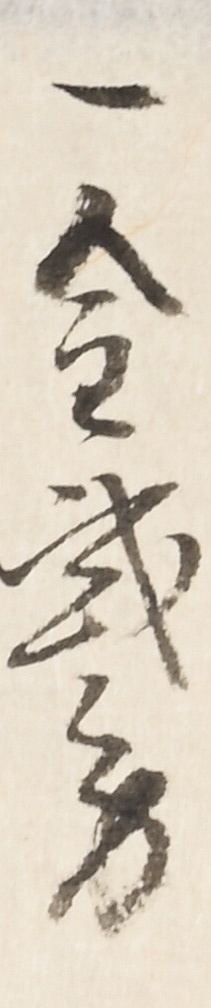一金弐分
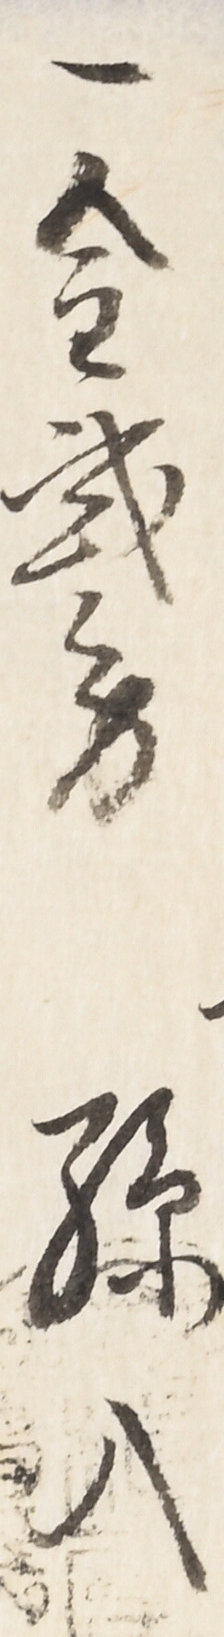一金弐分高遠
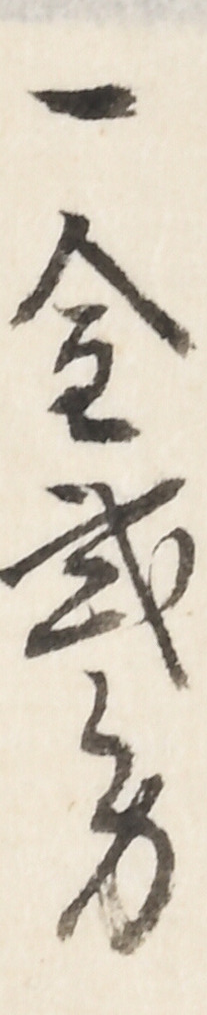一金弐分
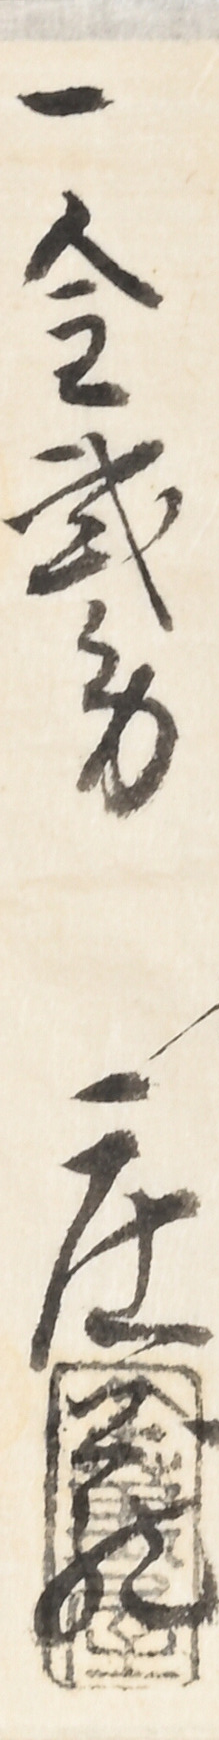一金弐分高遠
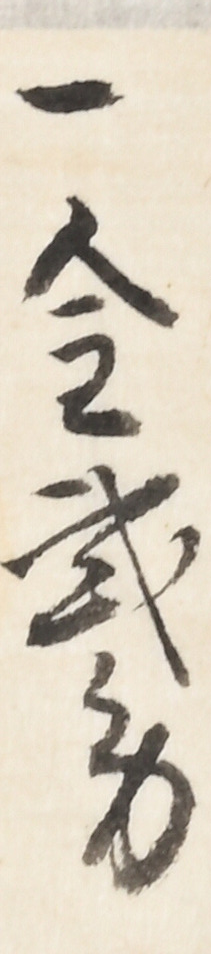一金弐分
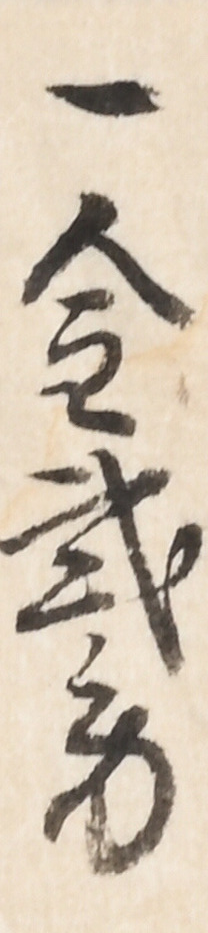一金弐分
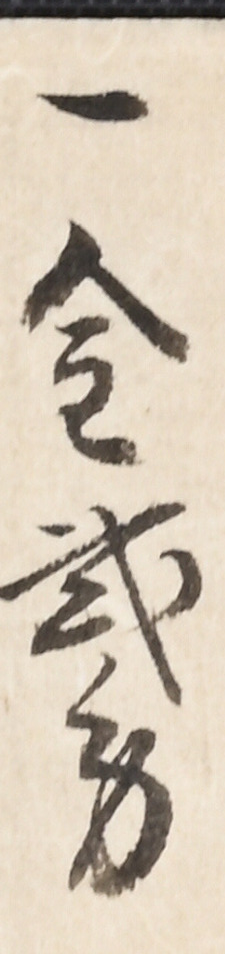一金弐分
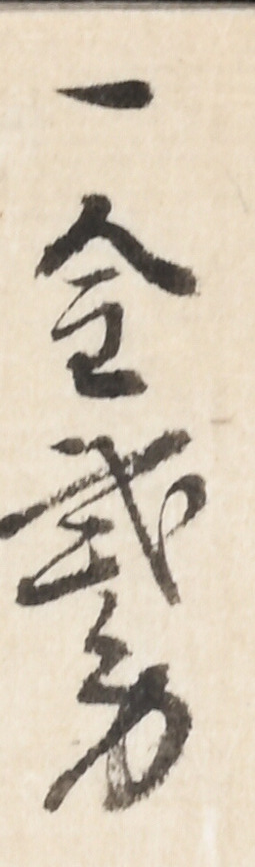一金弐分

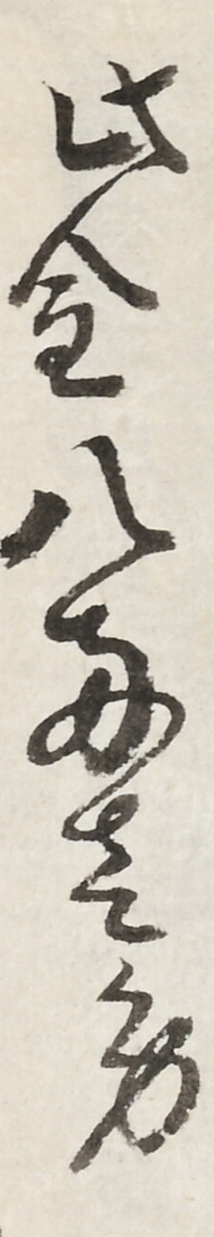此金八両壱分
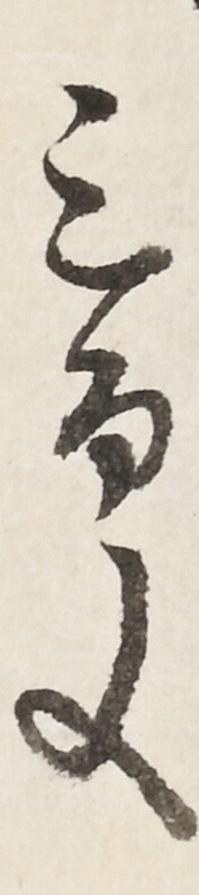三百文
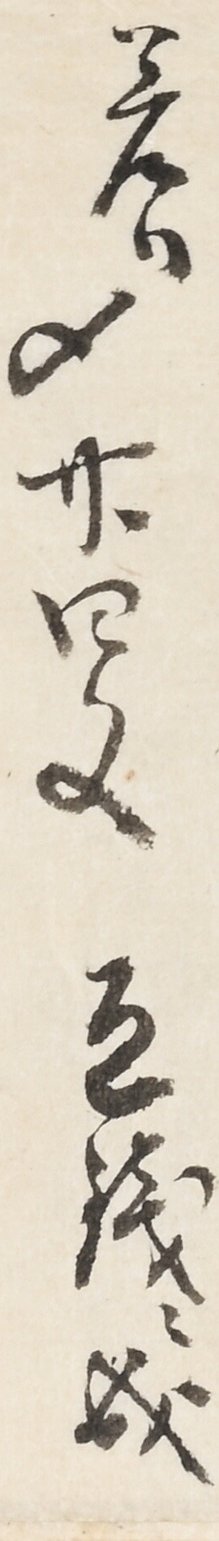〆廿四文過銭ニ成
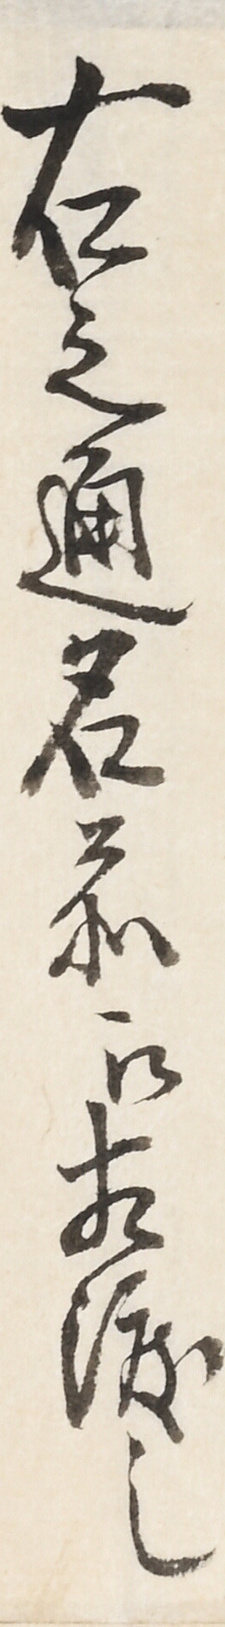右之通名前江相渡し
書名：信友講勘定簿
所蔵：伊那市立高遠町図書館・合同会社AMANE
